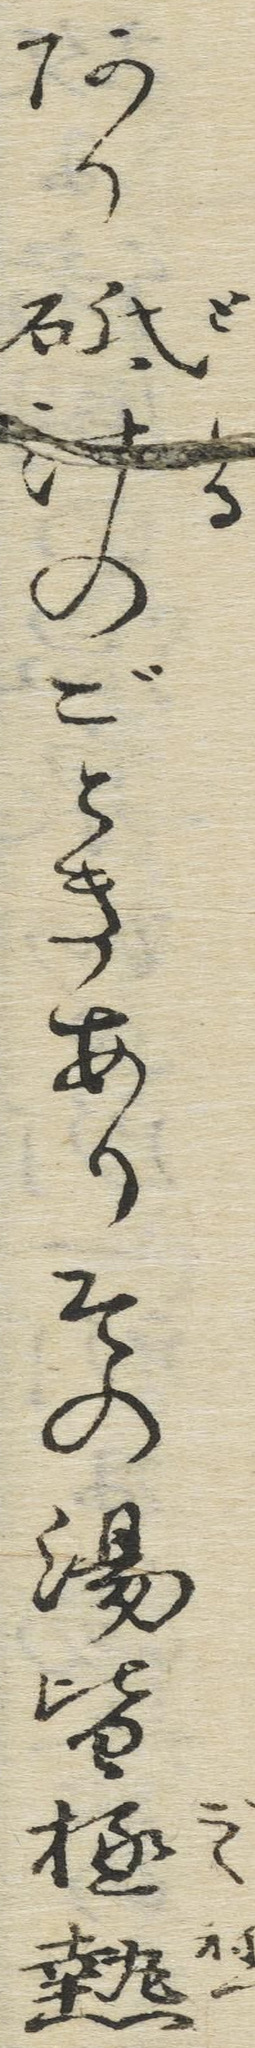あり砥汁のごときありその湯皆極熱
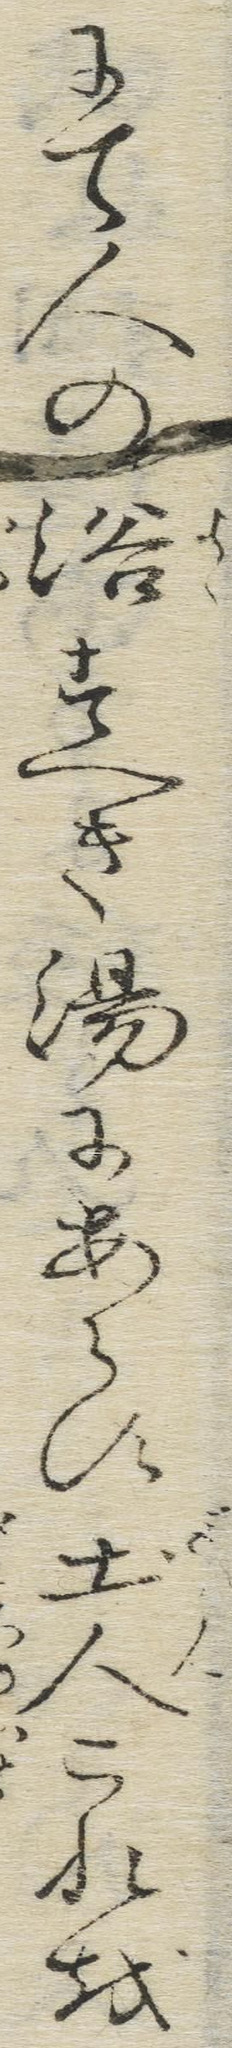にて人の浴すへき湯にあらす土人これを
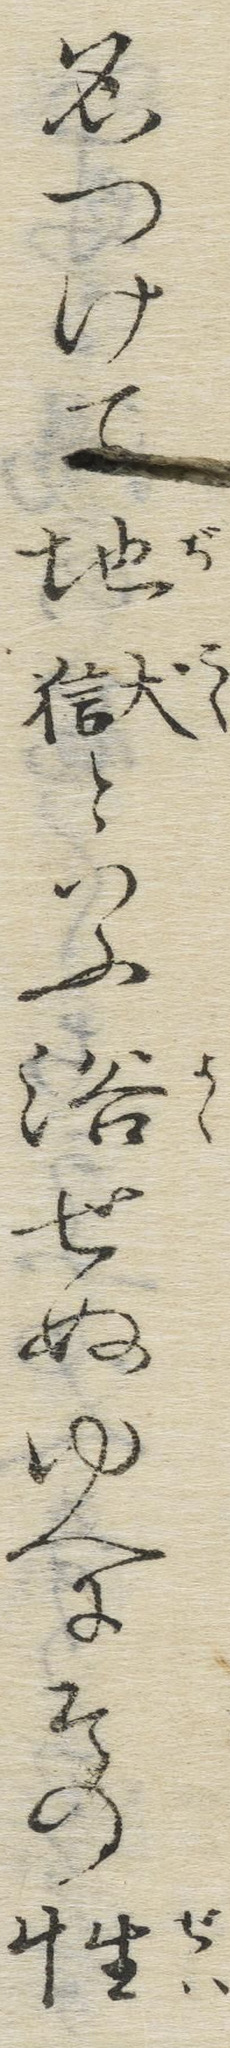名つけて地獄といふ浴せぬゆへにその性
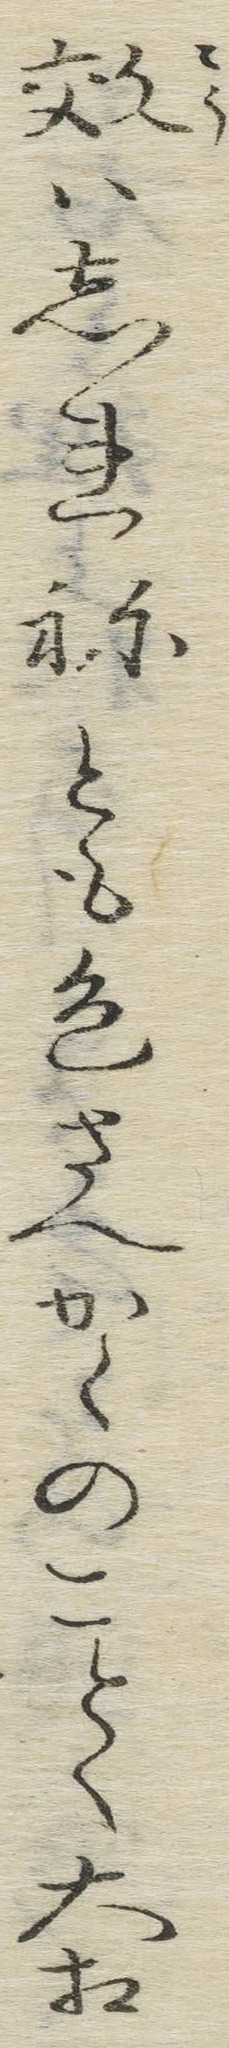効はしれねとも色さへかくのことく大相
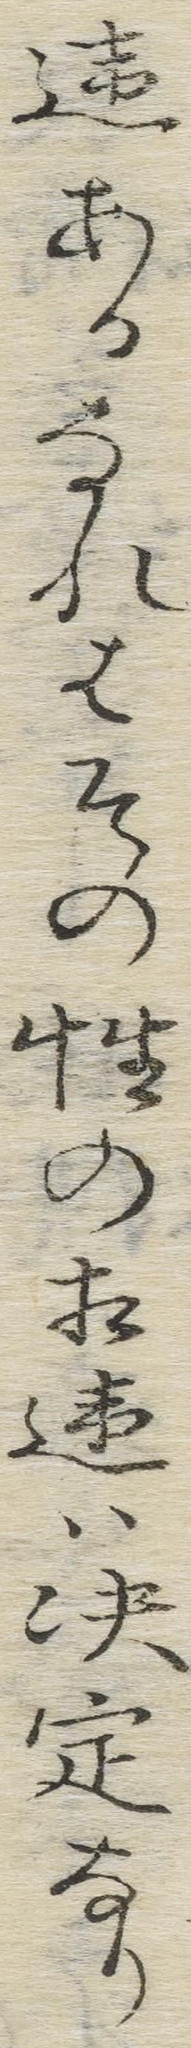違あるなれはその性の相違は決定なり
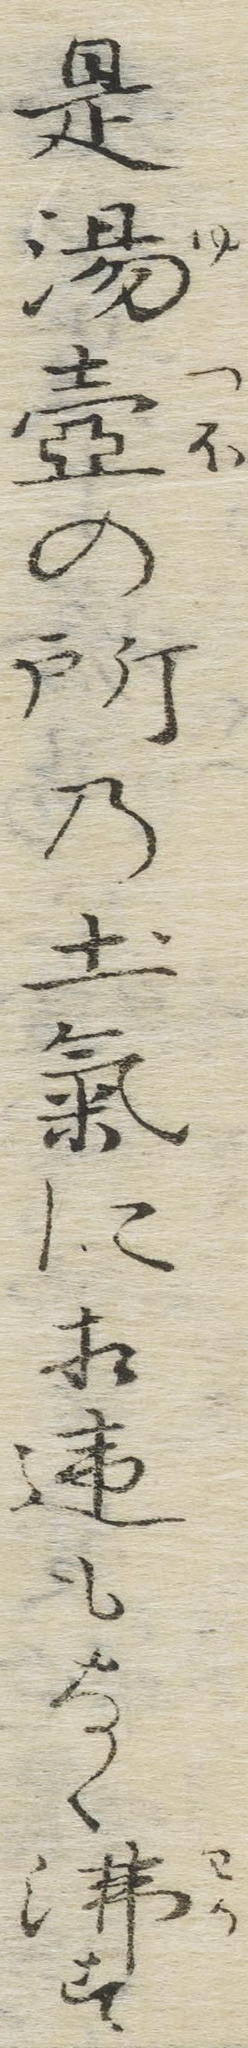是湯壺の所の土気に相違もなく沸す
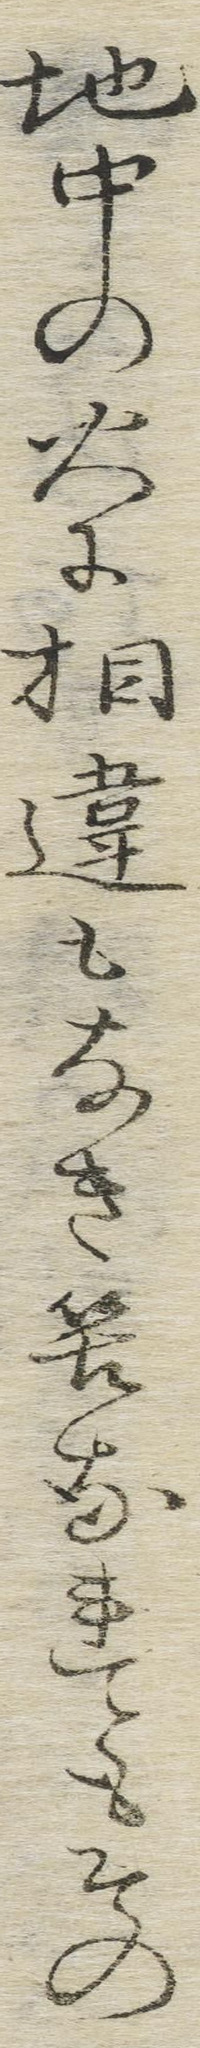地中の火に相違もなき筈なれともその
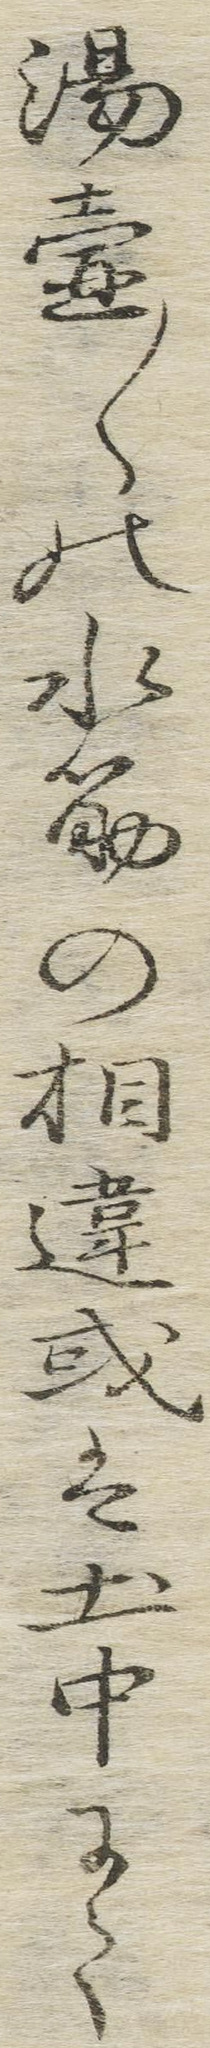湯壺〳〵の水筋の相違或は土中にて
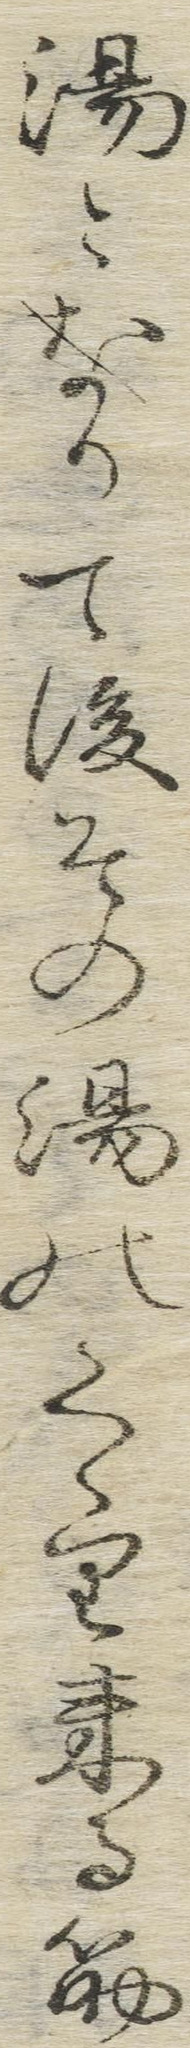湯となりて後その湯のくゝり来る筋

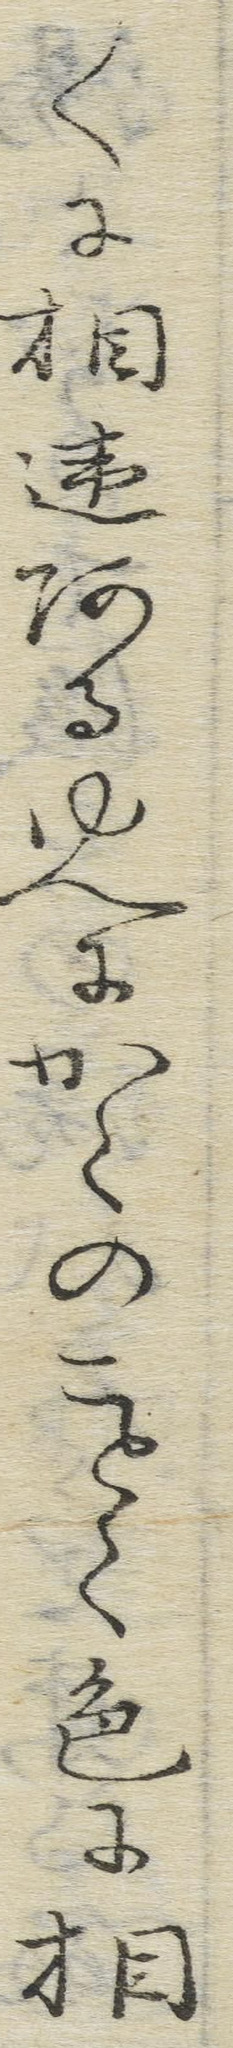〳〵に相違あるゆへにかくのことく色に相
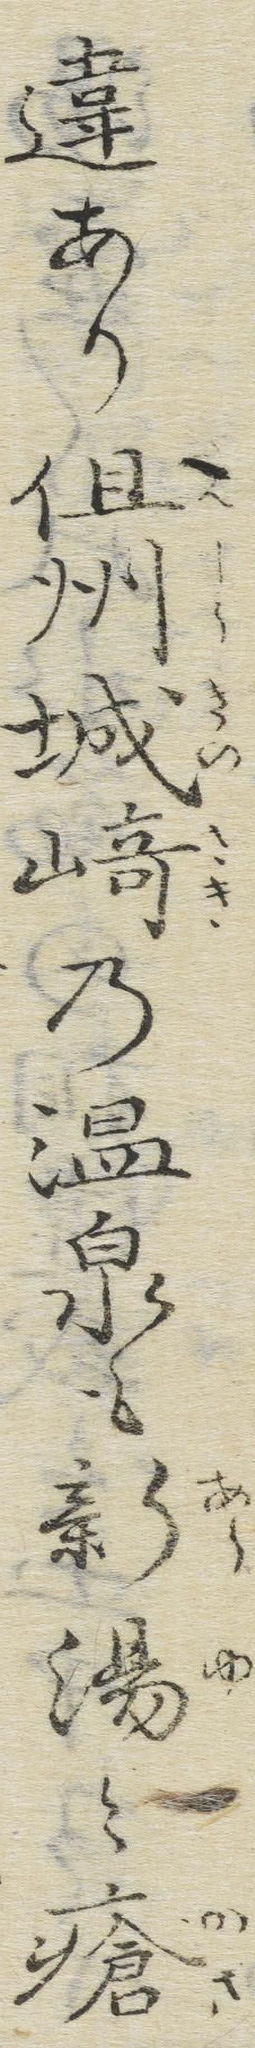違あり但州城崎の温泉も新湯と瘡
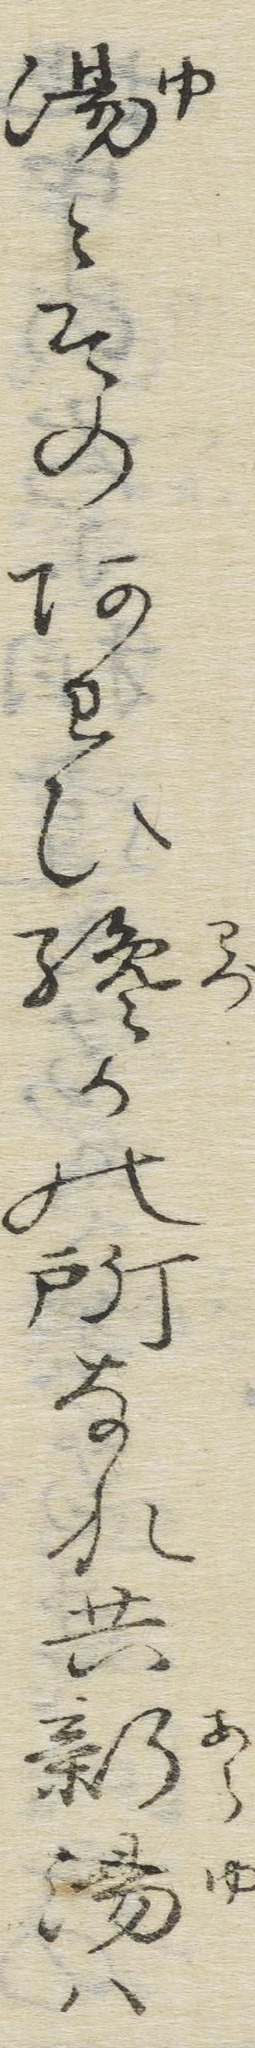湯とそのあわひ纔かの所なれ共新湯は
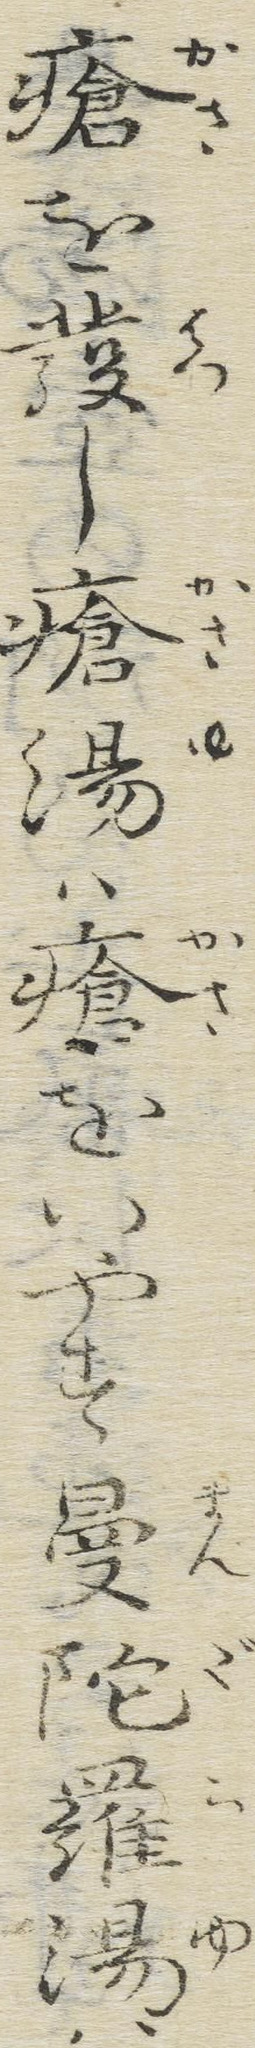瘡を発し瘡湯は瘡をいやす曼陀羅湯
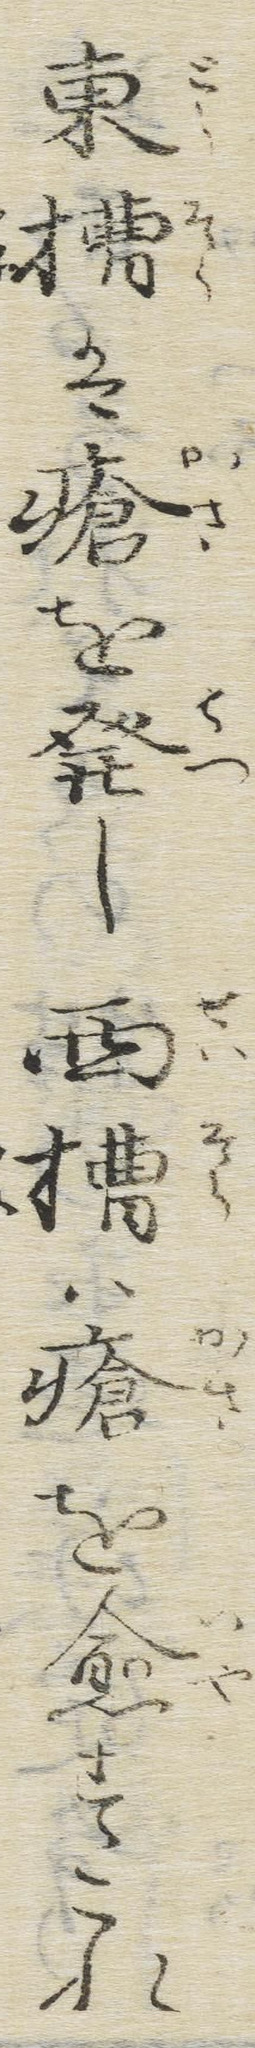東槽は瘡を発し西槽は瘡を愈すこれ
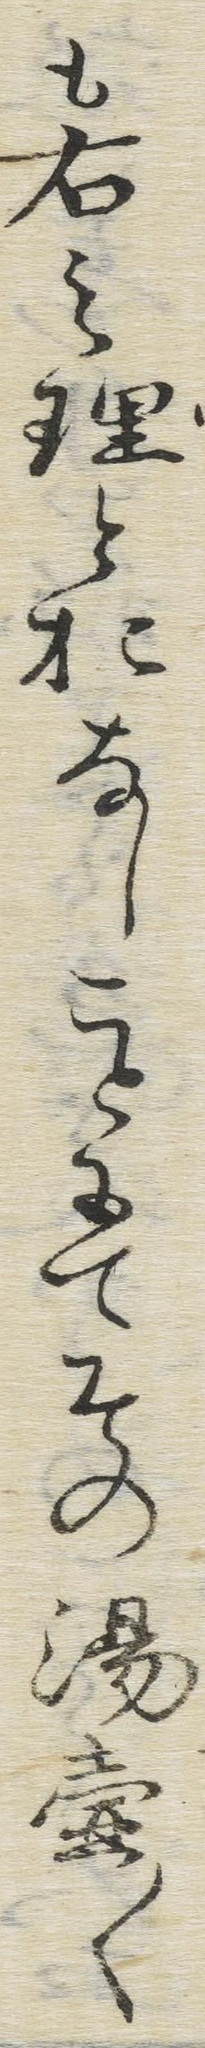も右の理とおなしことにてその湯壺〳〵
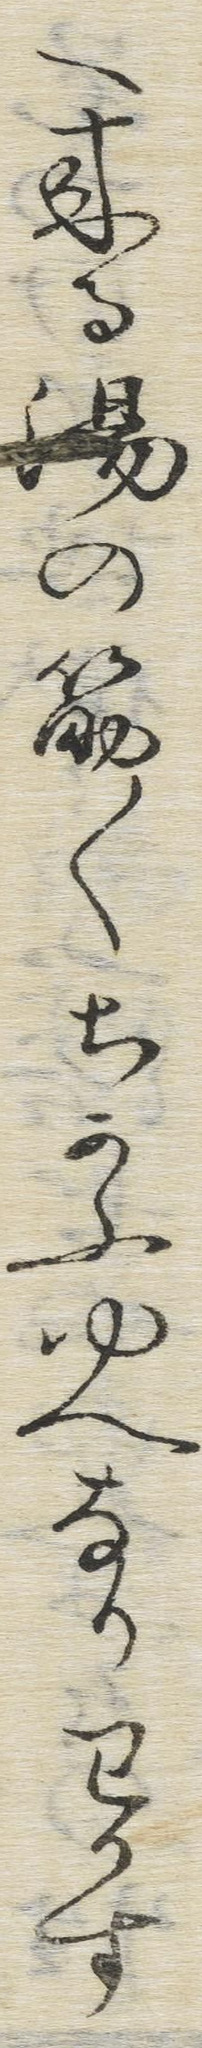へ来る湯の筋〳〵ちかふゆへなりわかす
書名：温泉考
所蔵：東京大学地震研究所図書室 Earthquake Research Institute Library, The University of Tokyo, JAPAN
